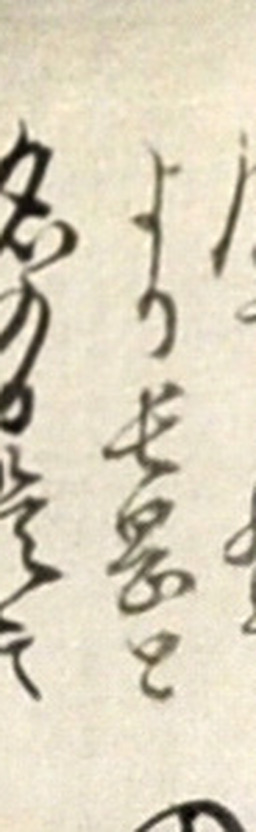名のる是も
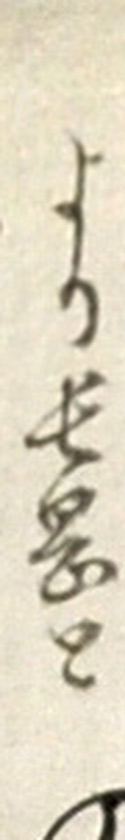より長岡と
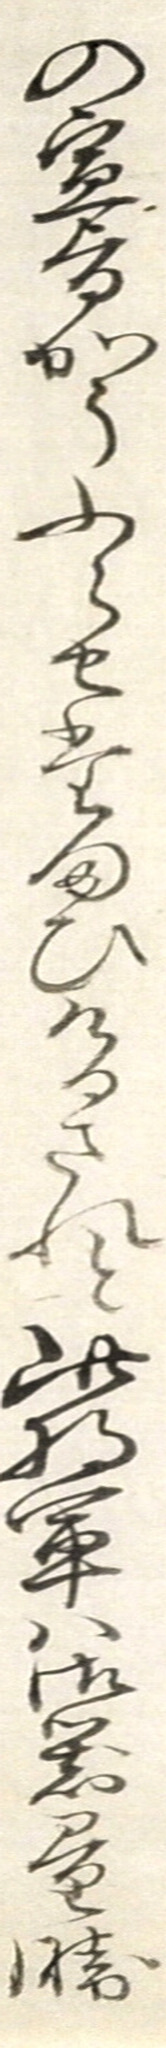の宣旨かうふらせたまひけるされと此将軍は御器量勝
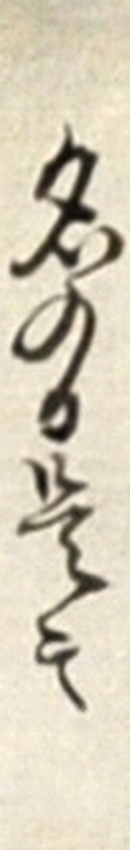名のる是も
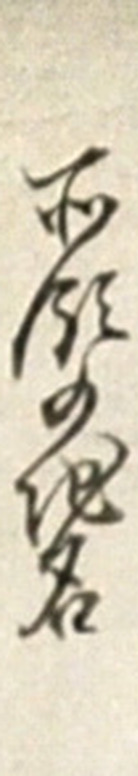所領の地名
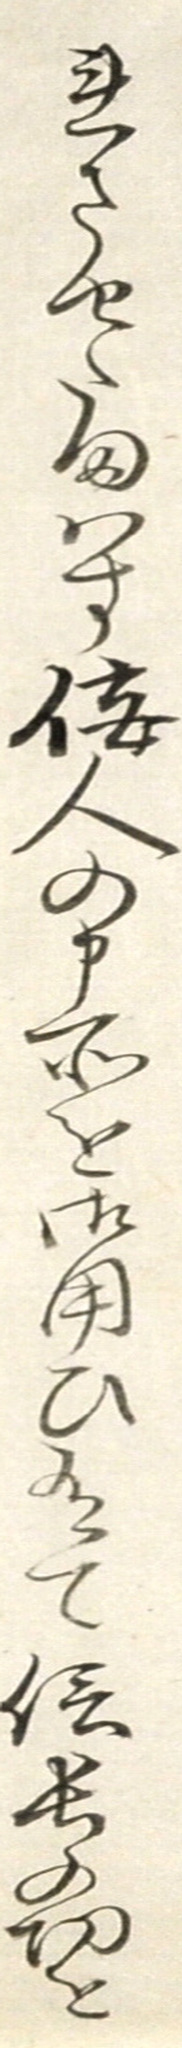れさせたまはす佞人の申所を御用ひ有て信長の功を
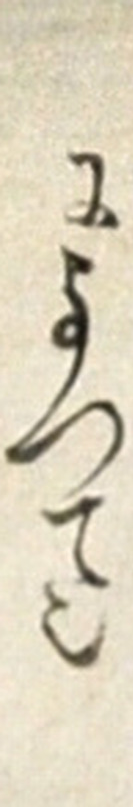によつて也
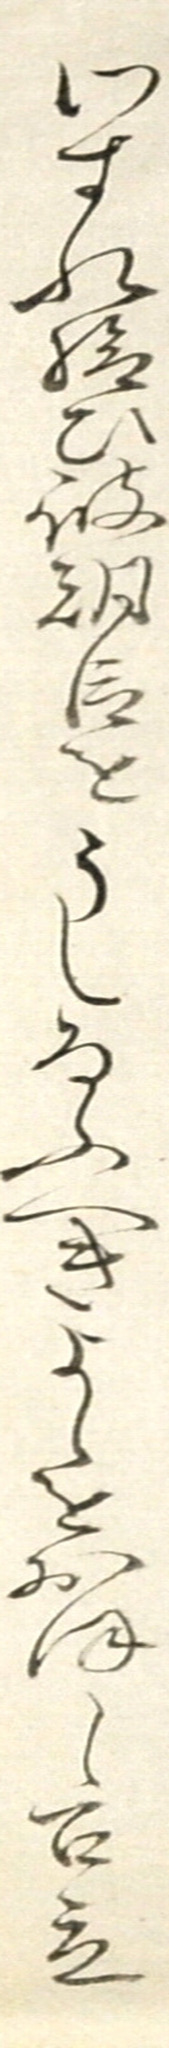わすれ給ひ彼朝臣をうしなふへきよしをおほし召立
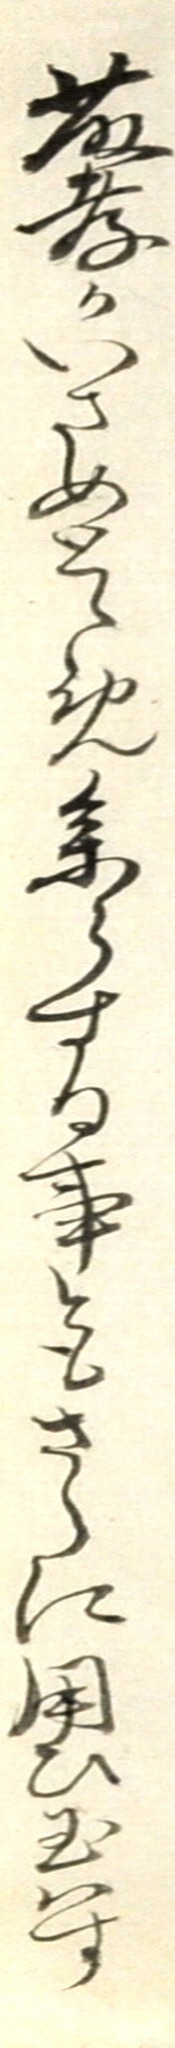藤孝かいさめとゝめ参らする事ともさらに用ひ玉はす

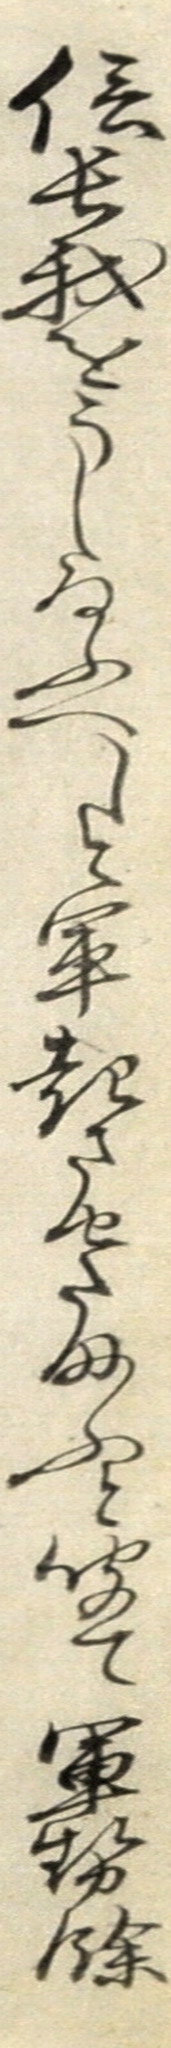信長我をうしなふへしと軍起させたまふと聞て軍勢余
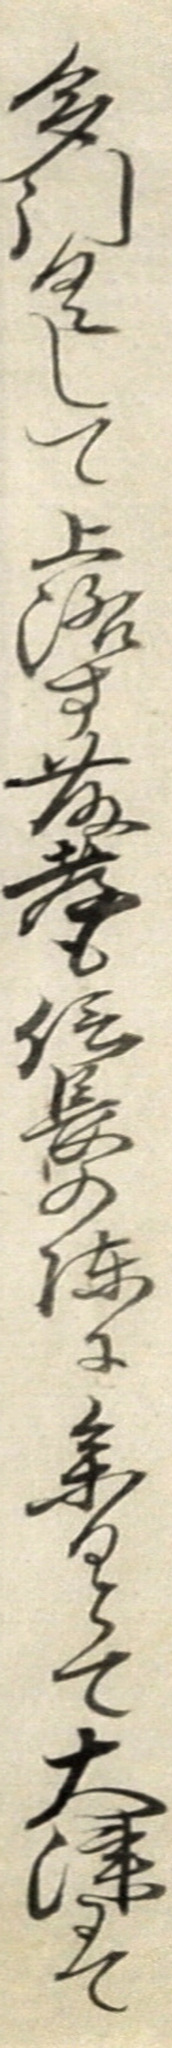多引具して上洛す藤孝も信長の陣に参るとて大津にて
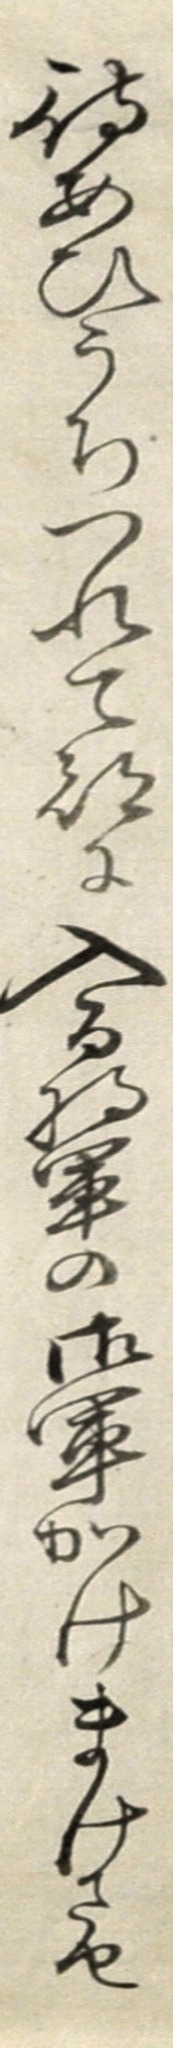待あひうちつれて都に入る将軍の御軍かけまけさせ
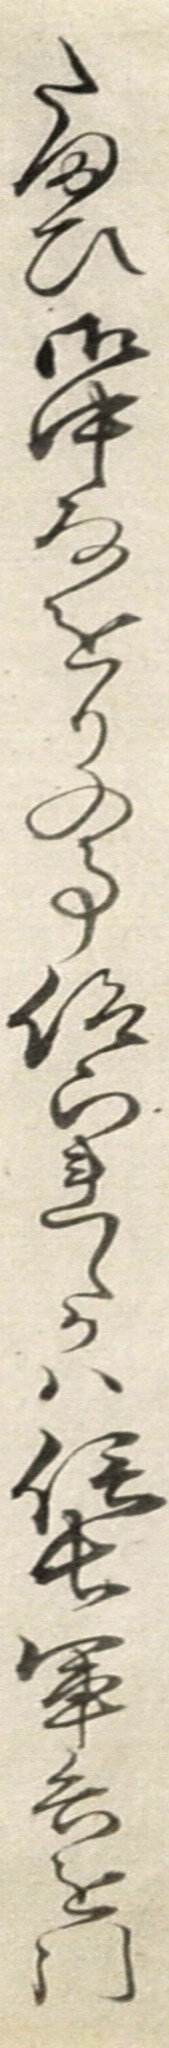たまひ御中なをりの事仰られしかは信長軍兵を引
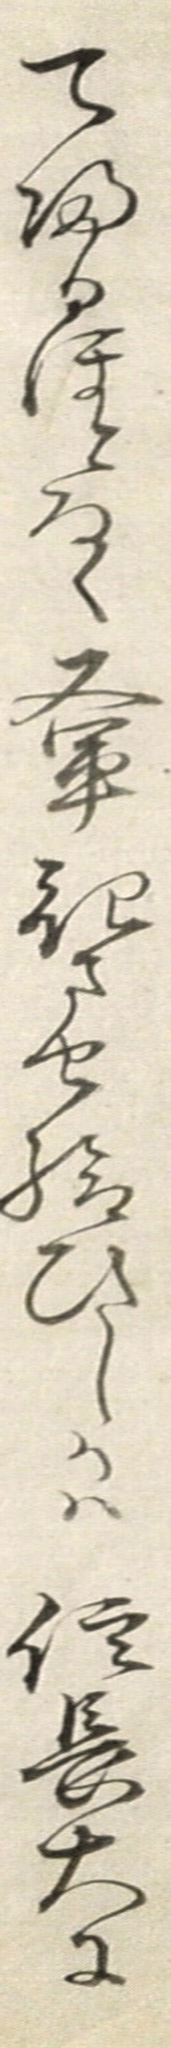て帰るほとなく又軍起させ給ひしかは信長大に
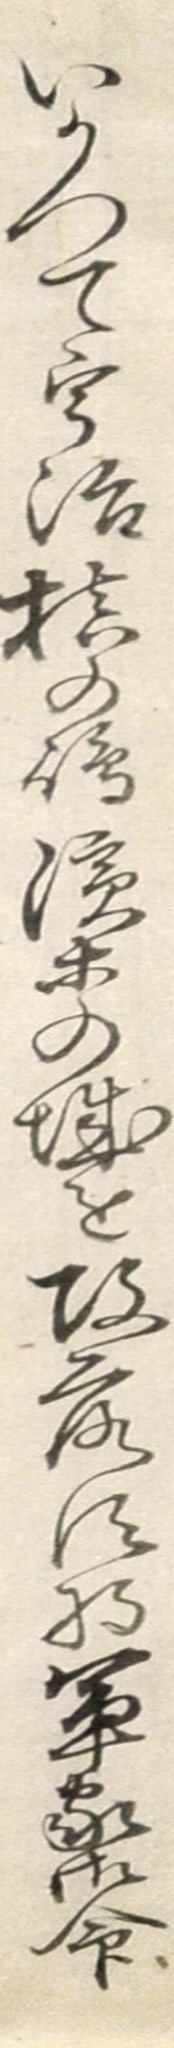いかつて宇治槙の島浜等の城を攻落す将軍家御命
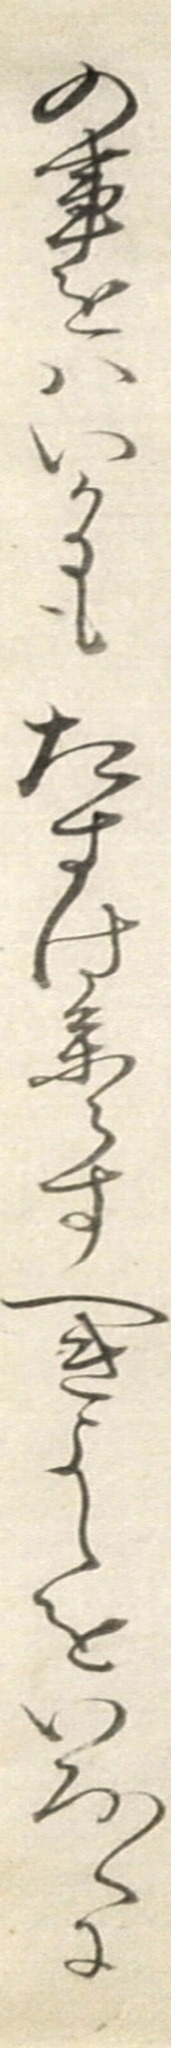の事をはいかにもたすけ参らすへきよしをいろ〳〵に
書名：藩翰譜（七・下）
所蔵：伊那市立高遠町図書館・合同会社AMANE
